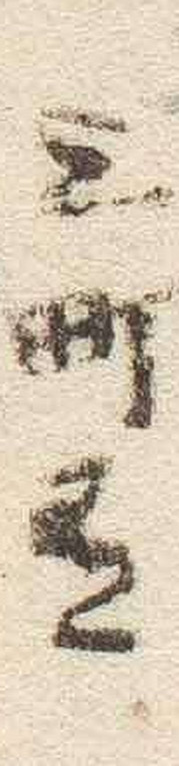三町有
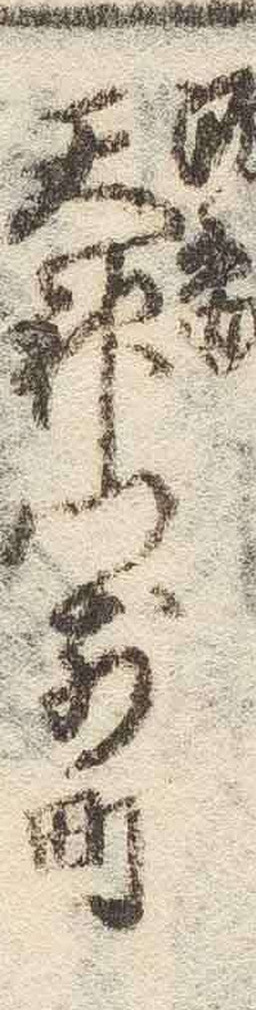天神門前町
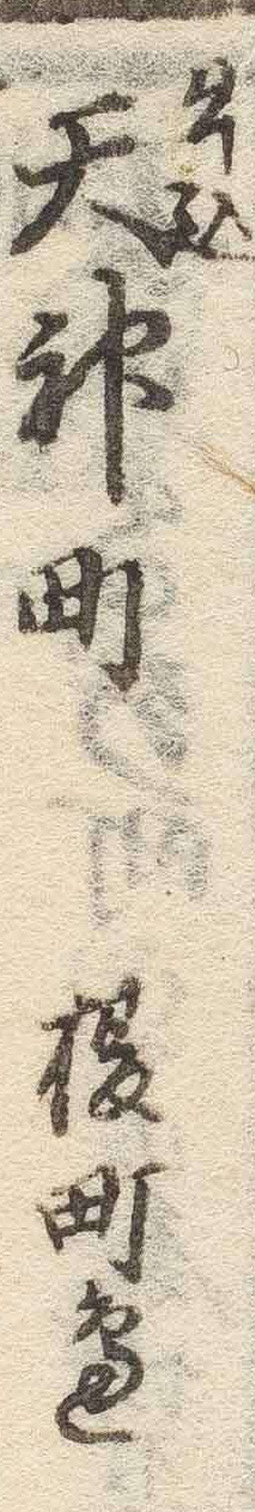天神町榎町辺
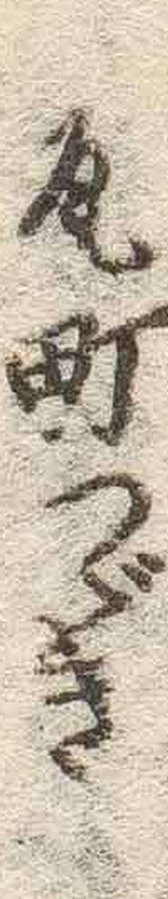瓦町つゞき
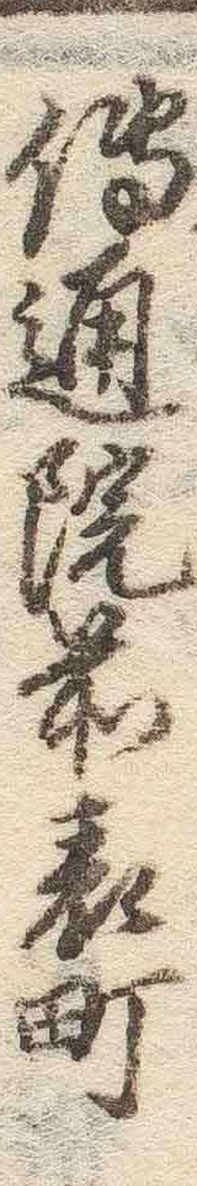伝通院前表町
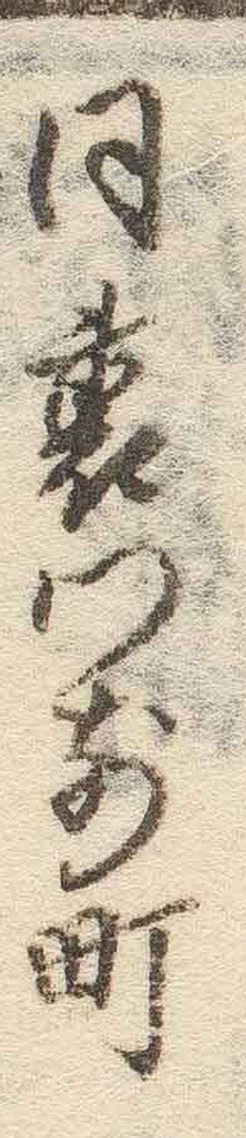同裏門前町
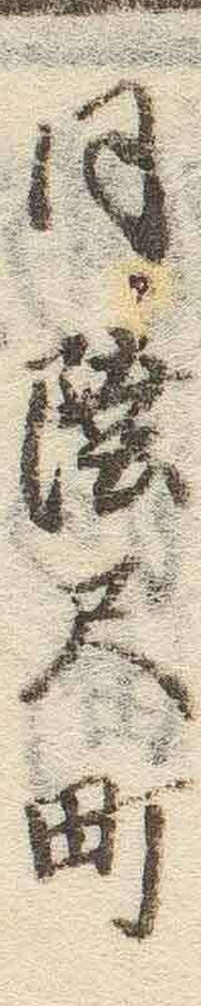同陸尺町
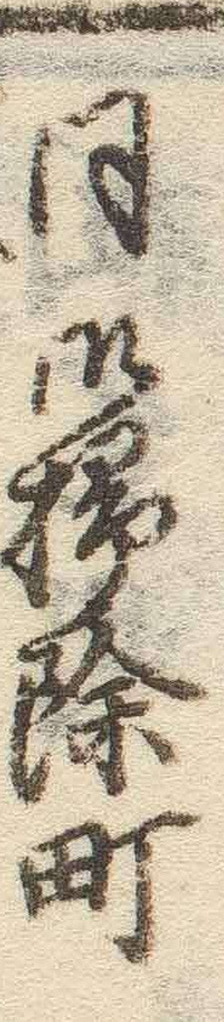同御掃除町
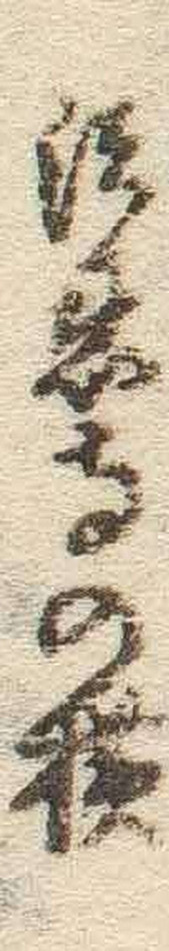法恩寺の横
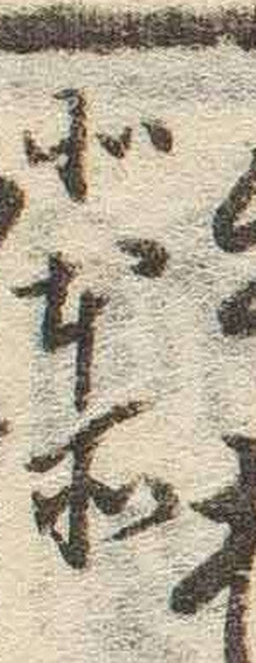北本所
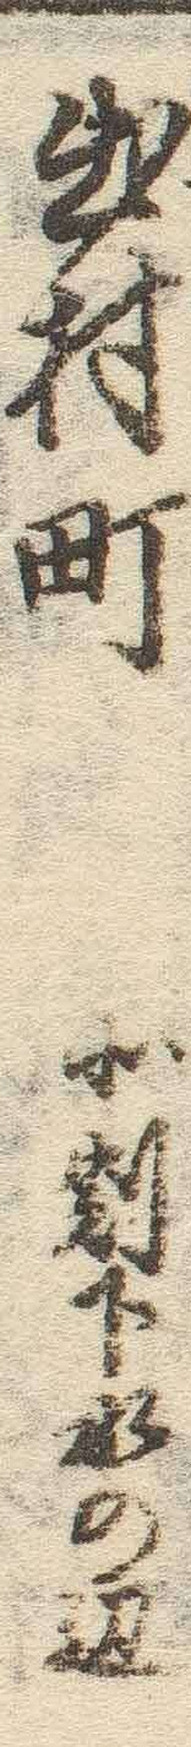出村町北割下水の辺
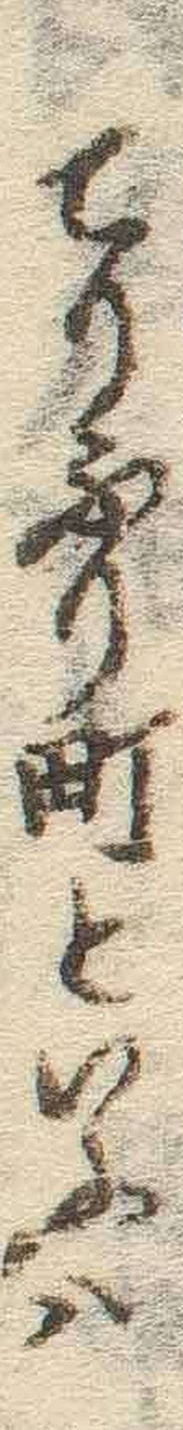てりふり町といふは
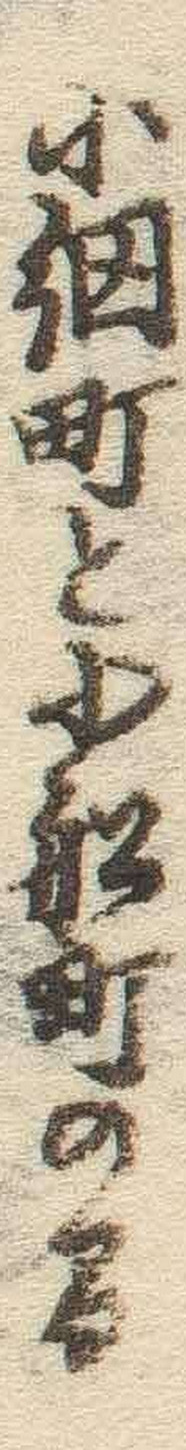小網町と小船町の間
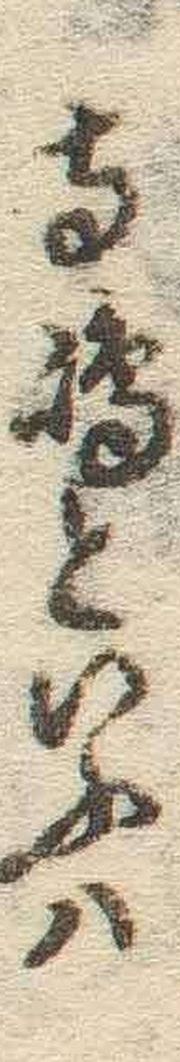寺島といふは
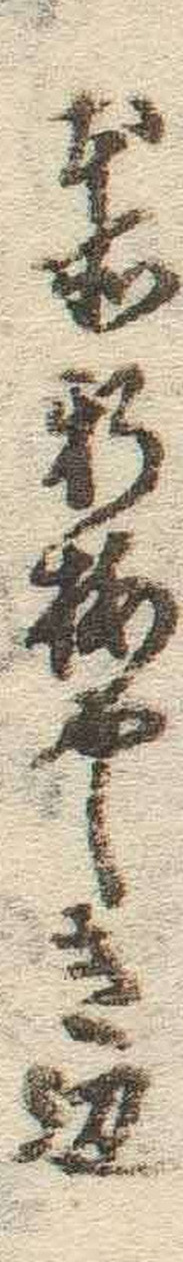本所新梅やしき辺

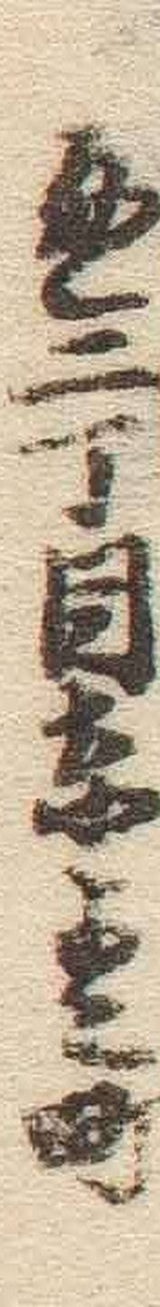通二丁目東よこ町
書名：江戸町独案内
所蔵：東京学芸大学附属図書館 国文学研究資料館
